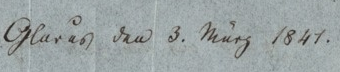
Glarus den 3. März 1841.
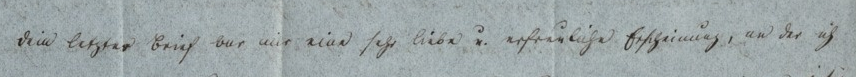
Dein letzter Brief war mir eine sehr liebe u. erfreuliche Erscheinung, an der ich
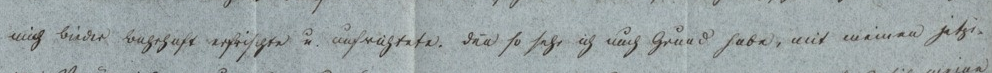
mich wieder wahrhaft erfrischte u. aufrichtete. Denn so sehr ich auch Grund habe, mit meinen jetzi-
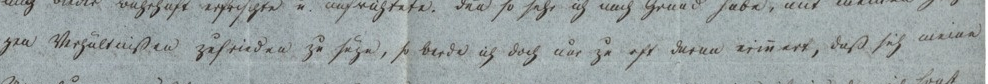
gen Verhältnissen zufrieden zu seyn, so werde ich doch nur zu oft daran erinnert, daß sich meine
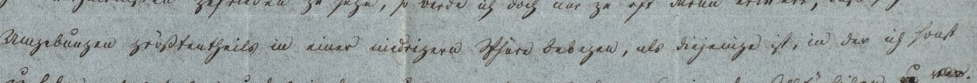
Umgebungen größtentheils in einer niedrigern Sphäre bewegen, als diejenige ist, in der ich sonst
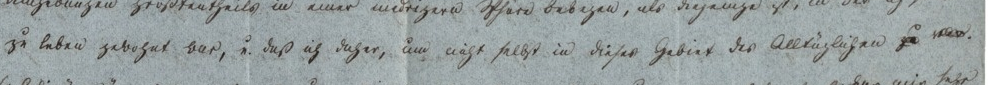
zu leben gewohnt war, u. daß ich daher, um nicht selbst in dieses Gebiet des Alltäglichen zu ver–
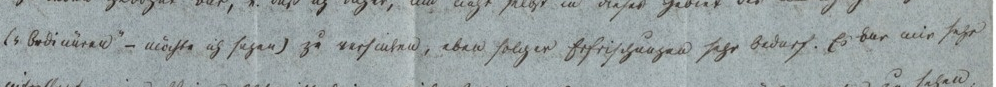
(«Ordinären» – möchte ich sagen) zu versinken, eben solcher Erfrischungen sehr bedarf. Es war mir sehr
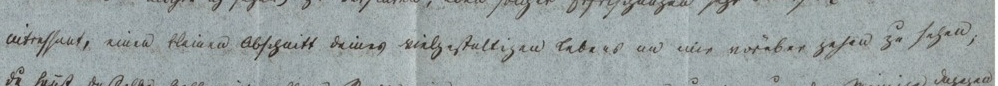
intressant, einen kleinen Abschnitt Deines vielgestaltigen Lebens an mir vorüber gehen zu sehen;
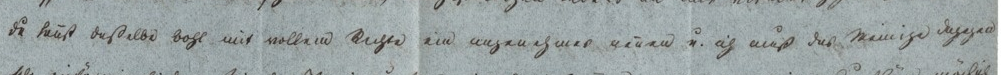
Du kannst dasselbe wohl mit vollem Rechte ein angenehmes nennen u. ich muß das Meinige dagegen
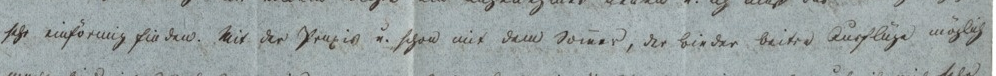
sehr einförmig finden. Mit der Praxis u. schon mit dem Sommer, der wieder weitre Ausflüge möglich
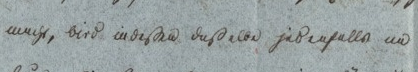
macht, wird indessen dasselbe jedenfalls an
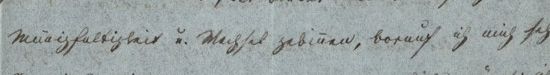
Mannigfaltigkeit u. Wechsel gewinnen, worauf ich mich sehr
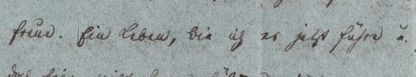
freue. Ein Leben, wie ich es jetzt führe u.
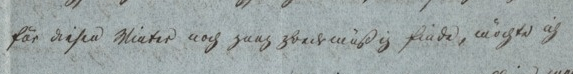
für diesen Winter noch ganz zweckmäßig finde, möchte ich
